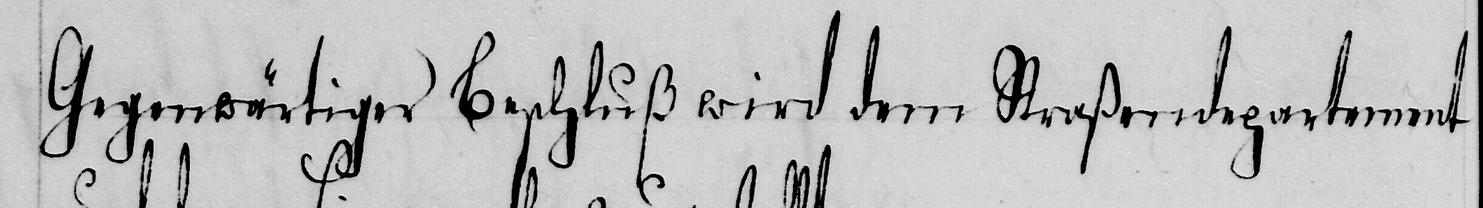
Gegenwärtiger Beschluß wird dem Straßendepartement
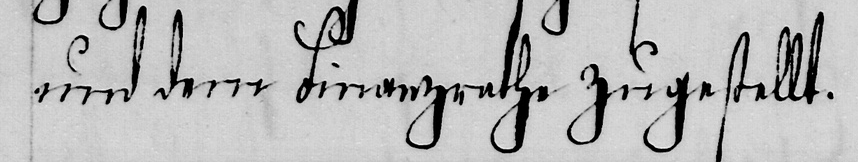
und dem Finanzrathe zugestellt.
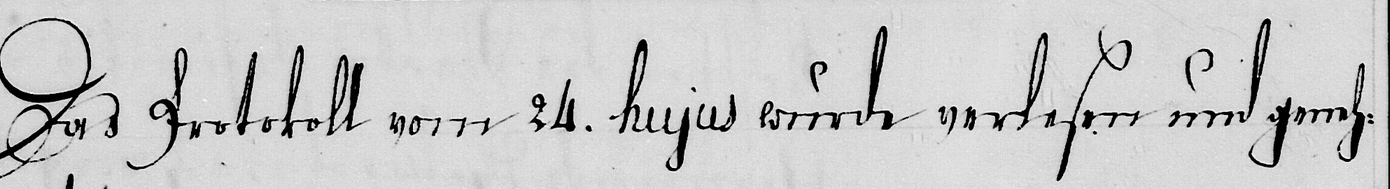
Das Protokoll vom 24. hujus wurde verlesen und gene¬
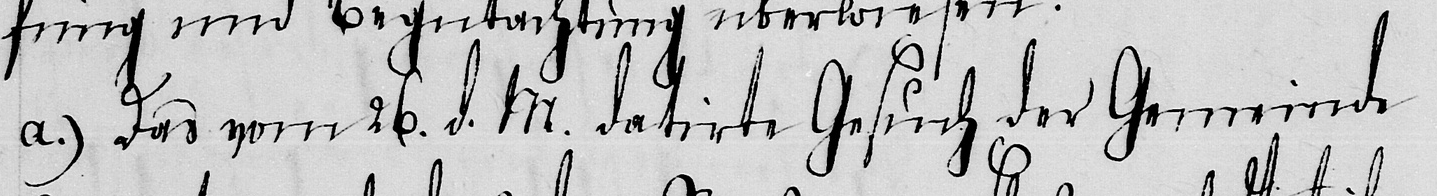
a.) Das vom 26. d. M. datirte Gesuch der Gemeinde
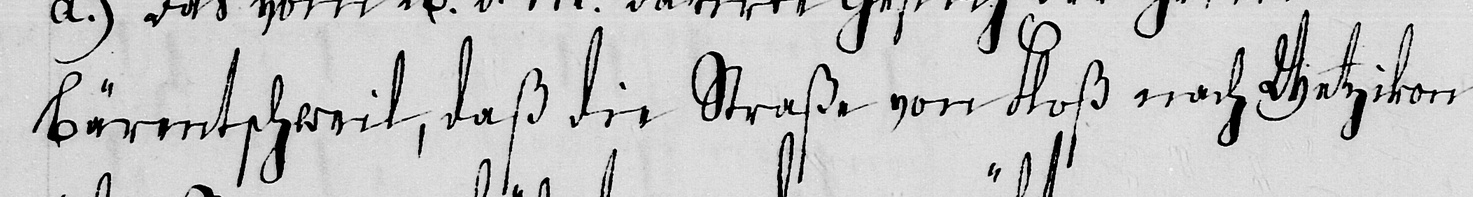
Bärentschweil, daß die Straße von Floß nach Wetzikon
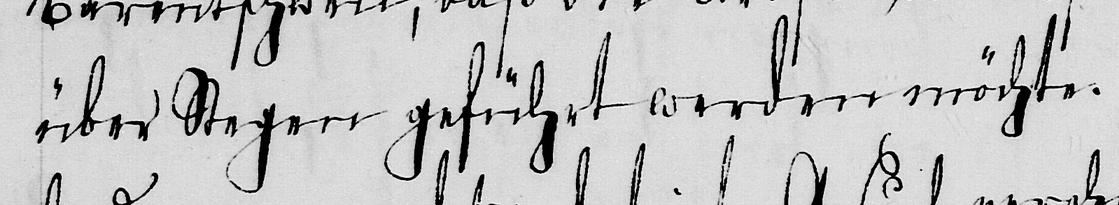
über Stegen geführt werden möchte.
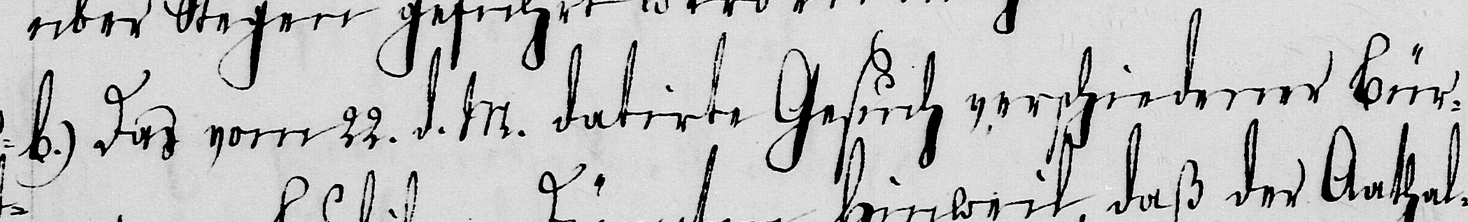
b.) Das vom 22. d. M. datirte Gesuch verschiedener Bür¬
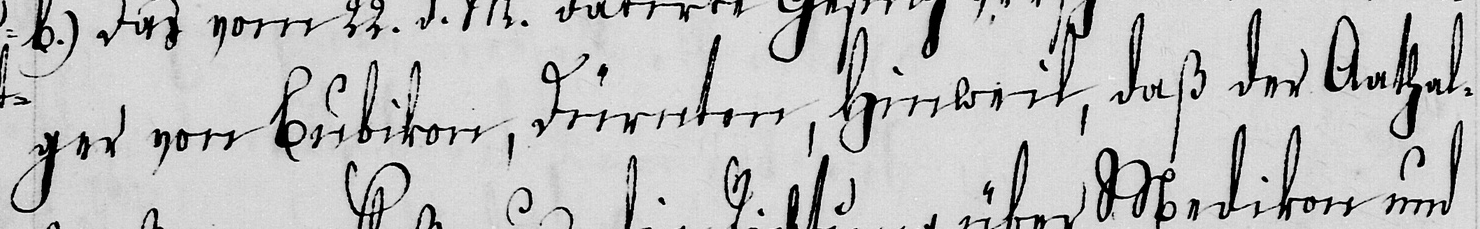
ger von Bubikon, Dürnten, Hinweil, daß der Aatha¬
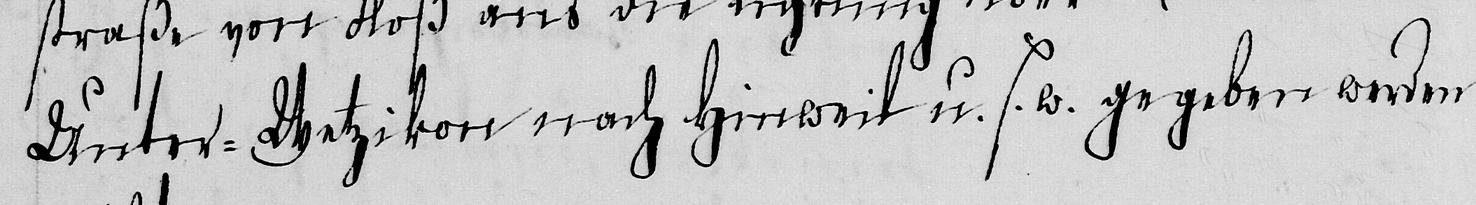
Unter-Wetzikon nach Hinweil u. s. w. gegeben werden
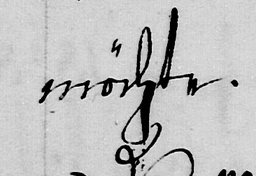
möchte.
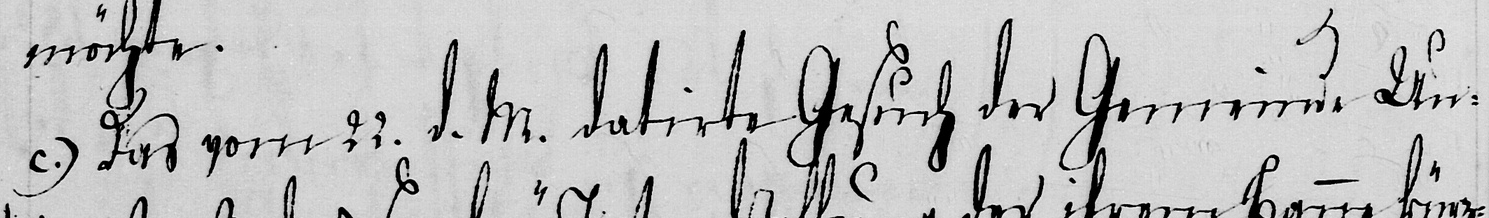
c.) Das vom 22. d. M. datirte Gesuch der Gemeinde Un¬
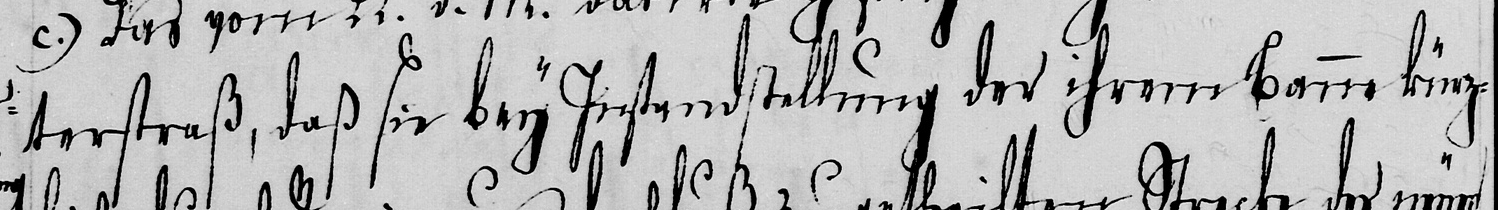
terstraß, daß sie bey Instandstellung der ihrem Banne kür¬
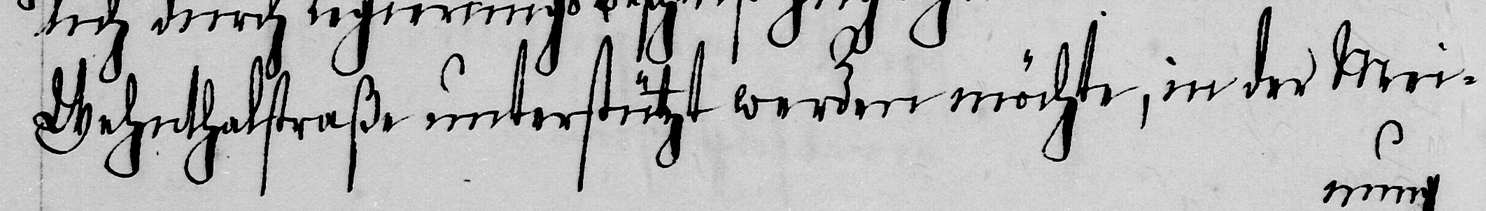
Wehnthalerstraße unterstützt werden möchte, in der Mei-
